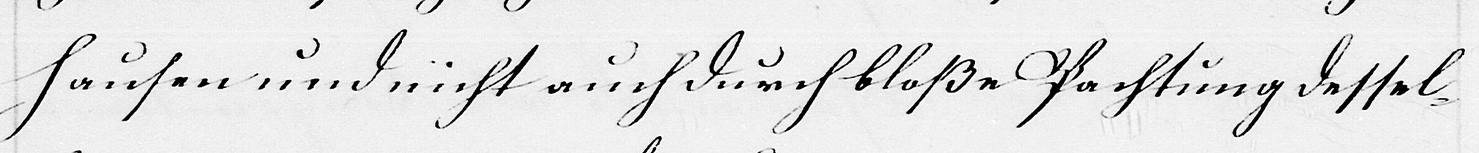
hausen und nicht auch durch bloße Pachtung dessel¬
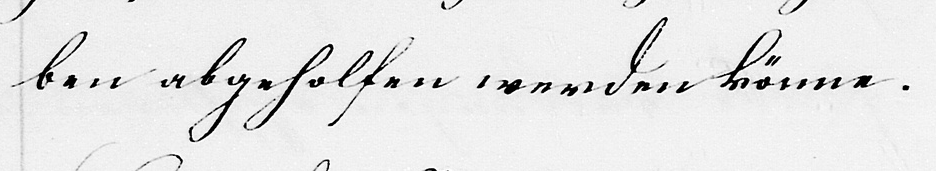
ben abgeholfen werden könne.
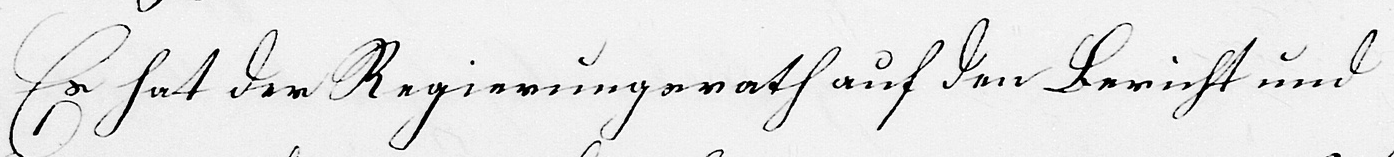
Es hat der Regierungsrath auf den Bericht und
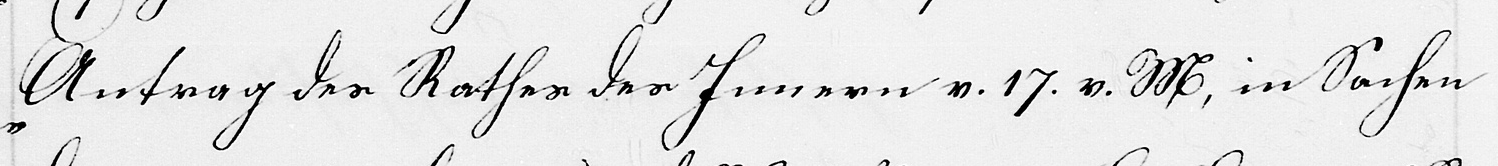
Antrag des Rathes des Innern v. 17. v. M, in Sachen
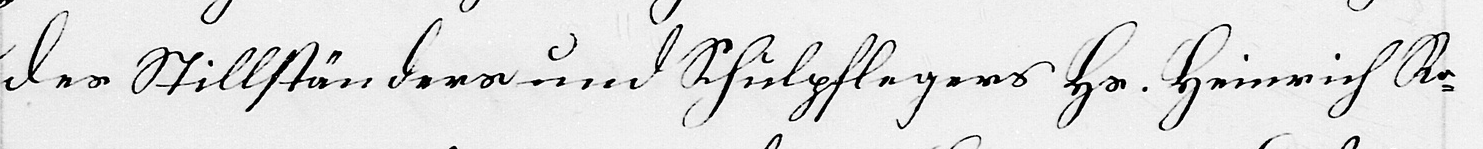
des Stillständers und Schulpflegers Hs. Heinrich Ro¬
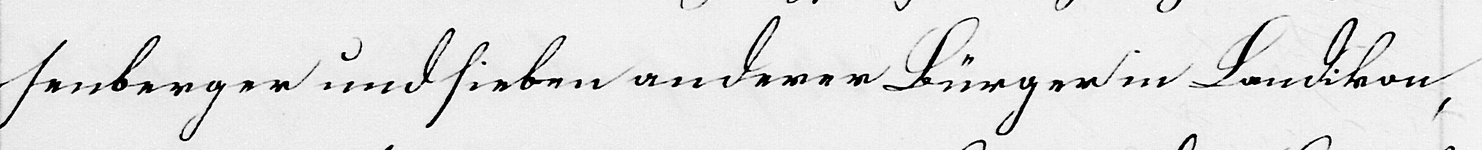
senberger und sieben anderer Bürger in Landikon,
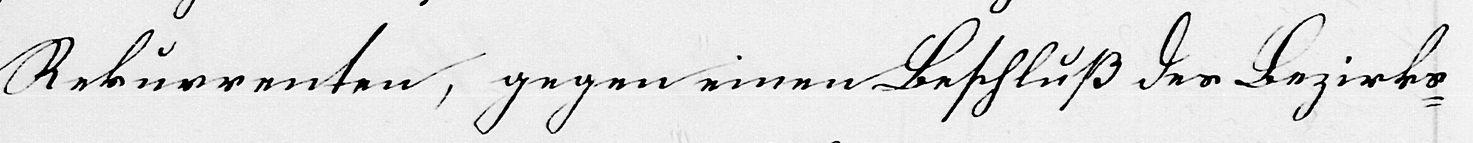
Rekurrenten, gegen einen Beschluß des Bezirks¬
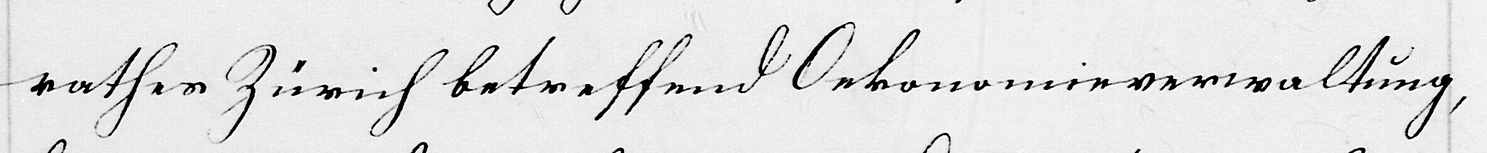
rathes Zürich betreffend Oekonomieverwaltung,
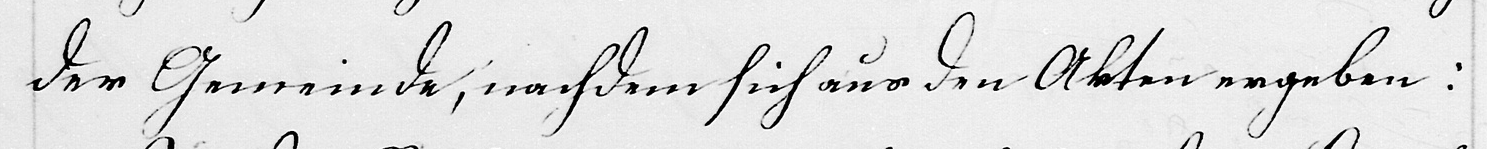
der Gemeinde, nachdem sich aus den Akten ergeben:
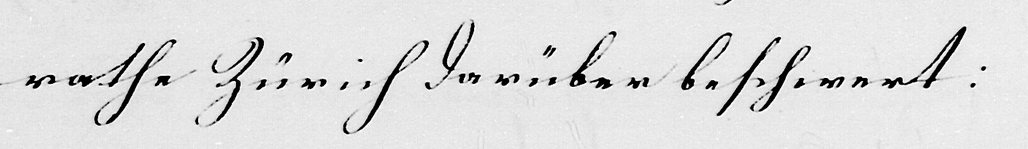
rathe Zürich darüber beschwert:
